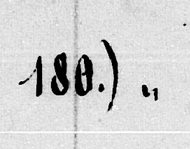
180.) “
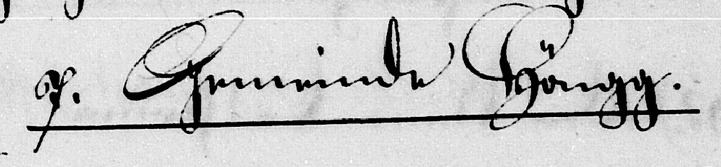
7. Gemeinde Höngg.
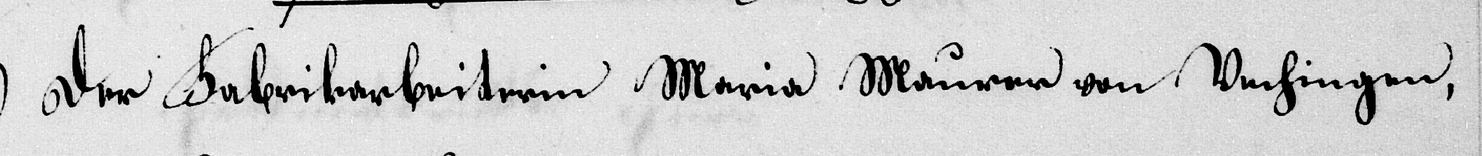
Der Fabrikarbeiterin Maria Maurer von Vechingen,
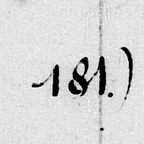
181.)
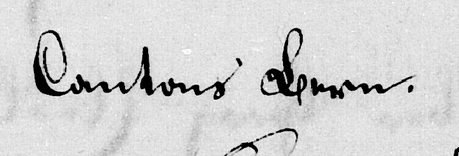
Cantons Bern.
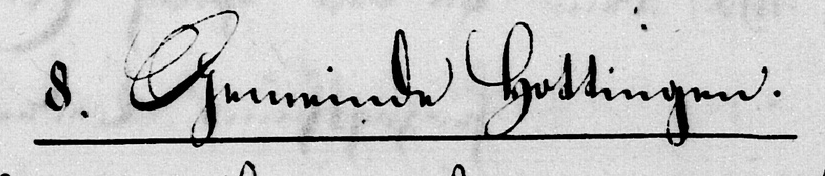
8. Gemeinde Hottingen.
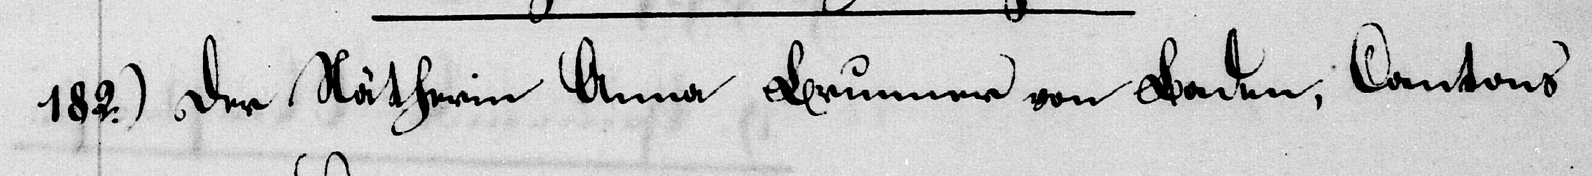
182.) Der Nätherin Anna Brunner von Baden, Cantons
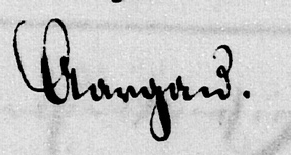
Aargau.
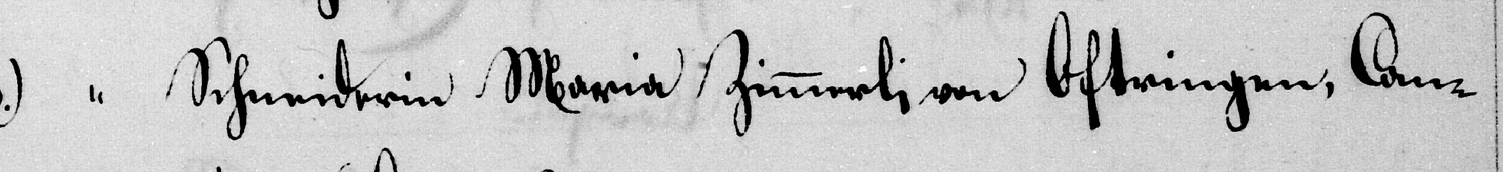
“ Schneiderin Maria Zimmerli von Oftringen, Can¬
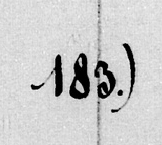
183.)
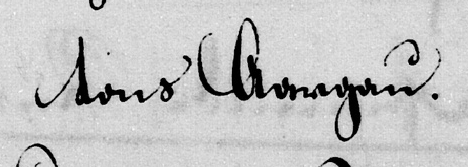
tons Aargau.
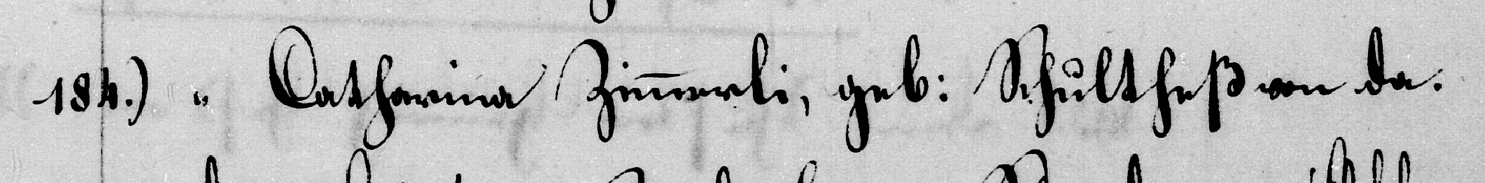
184.) “ Catharina Zimmerli, geb: Schultheß von da.
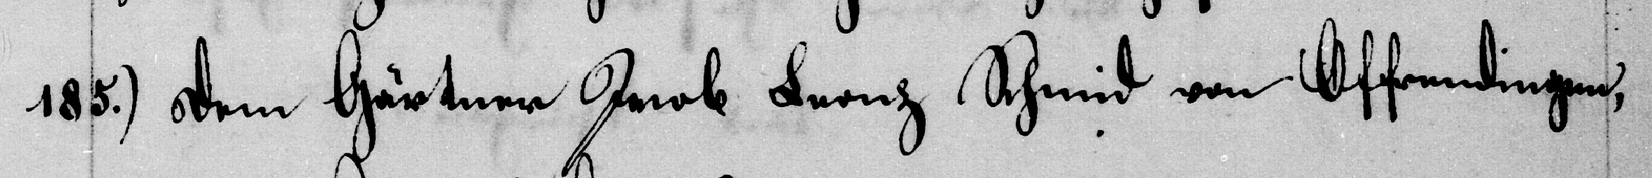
185.) Dem Gärtner Jacob Leonz Schmid von Offendingen,
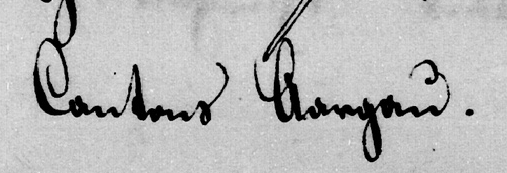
Cantons Aargau.
